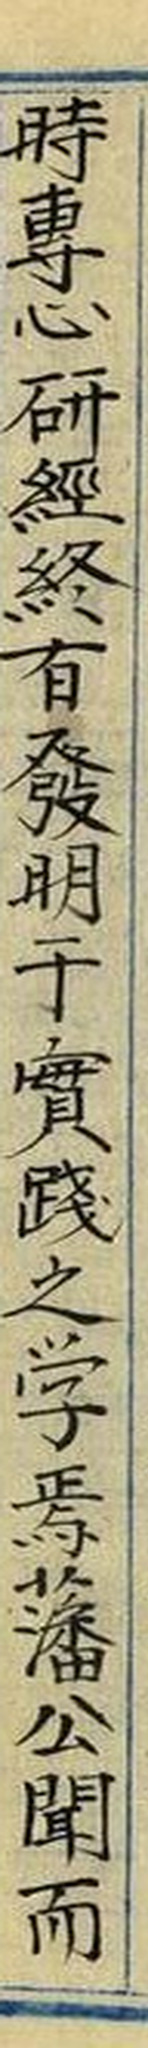時專心研經終有發明于實踐之学焉藩公聞而
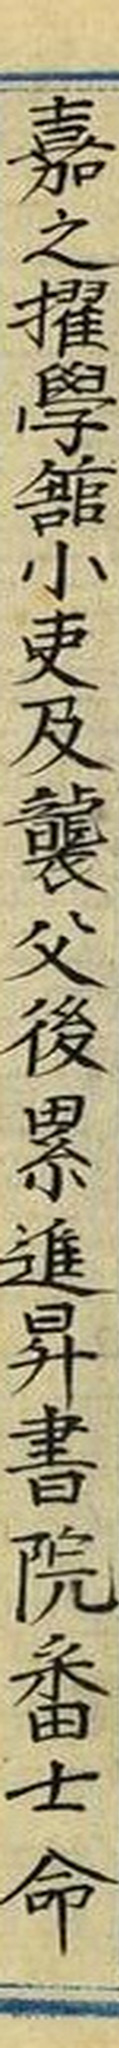嘉之擢學舘小吏及襲父後累進昇書院番士命
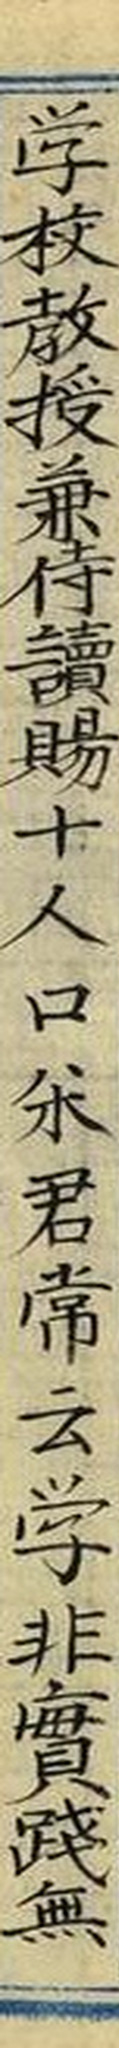学校教授兼侍讀賜十人口米君常云学非實踐無
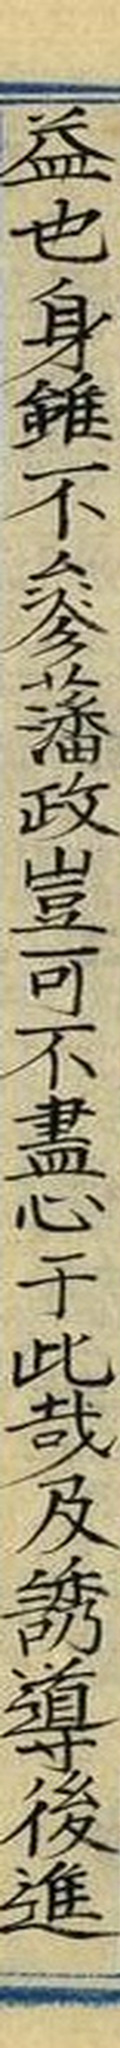益也身雖不參藩政豈可不𥁞心于此哉及誘導後進
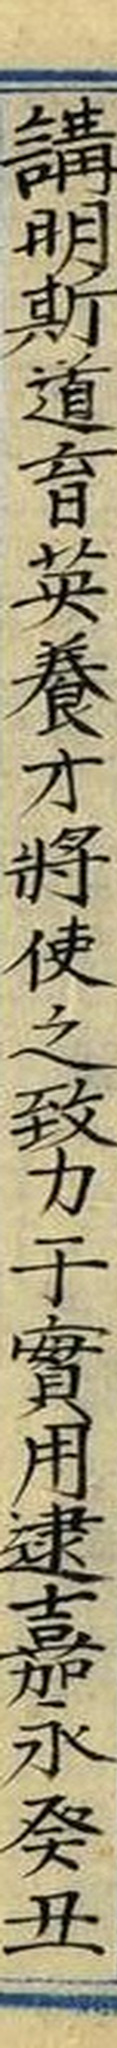講明斯道育英養才將使之致力于實用逮嘉永癸丑
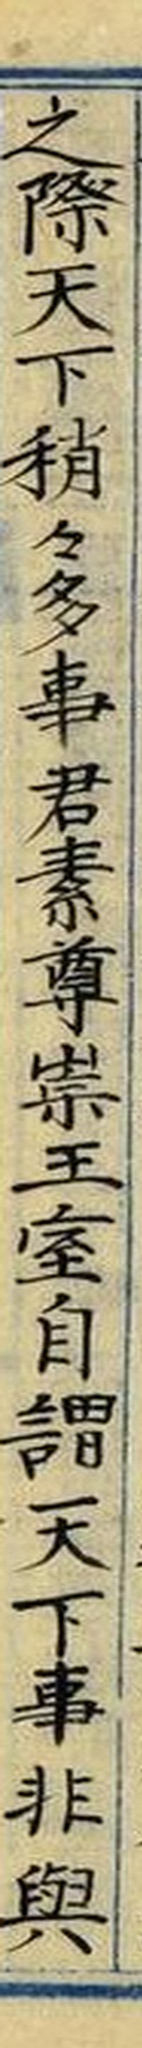之際天下稍々多事君素尊崇王室自謂天下事非與

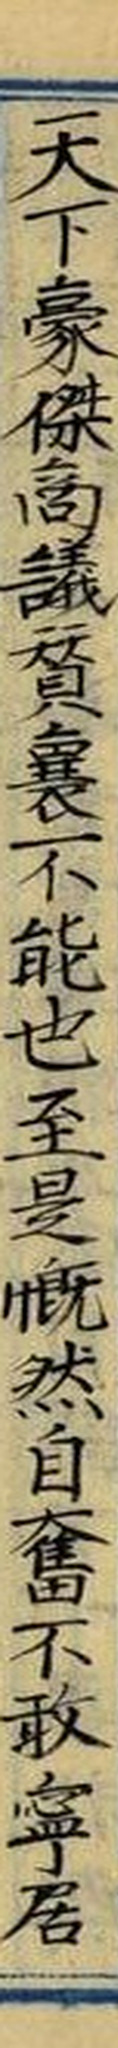天下豪傑商議賛囊不能也至是慨然自奮不敢寧居
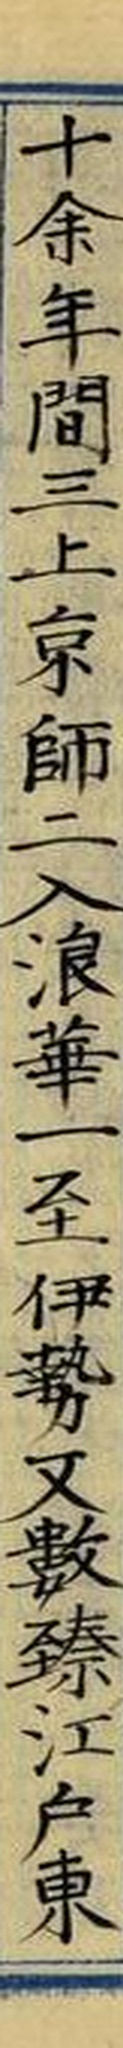十余年間三上京師二入浪華一至伊勢又數臻江戸東
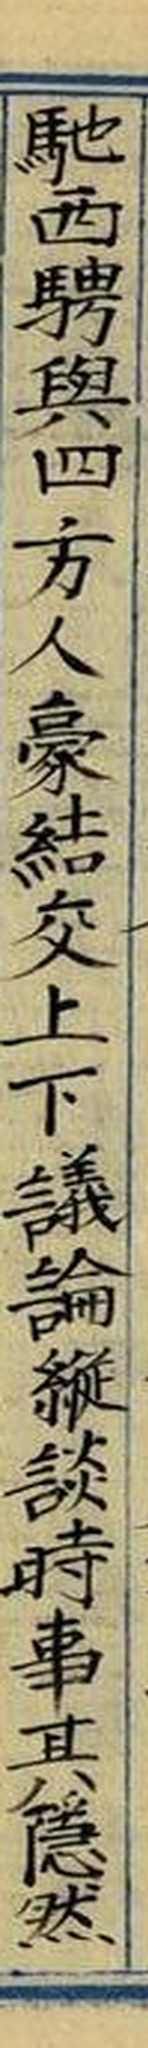馳西騁與四方人豪結交上下議論縦談時事其隠然
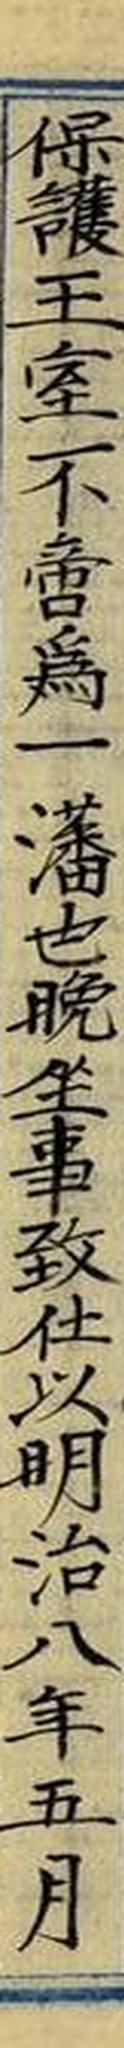保護王室不啻爲一藩也晩坐事致仕以明治八年五月
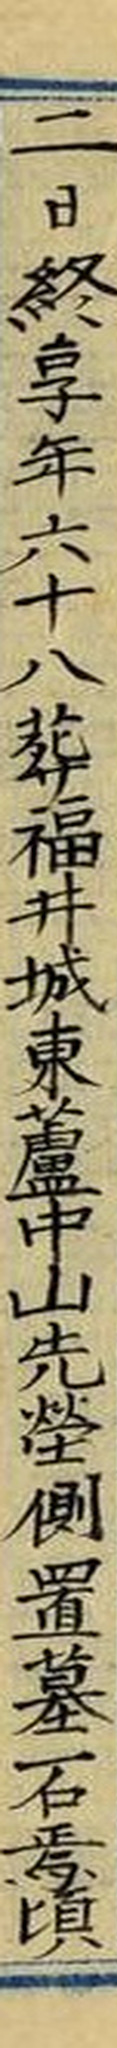二日終享年六十八葬福井城東蘆中山先塋側置墓石焉頃
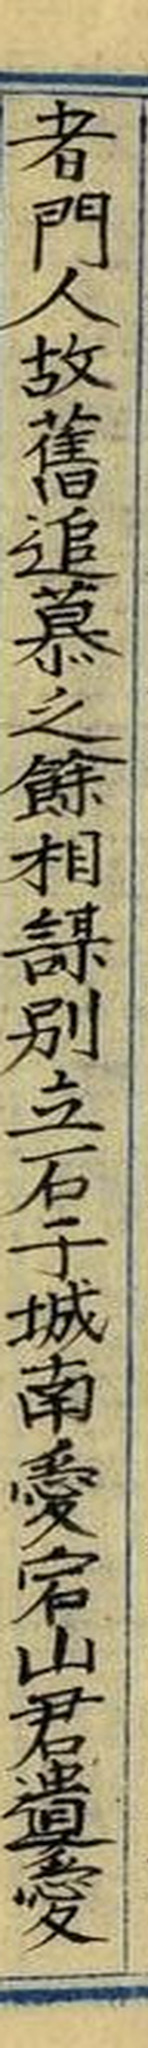者門人故𦾔追慕之餘相謀別立石于城南愛宕山君遺愛
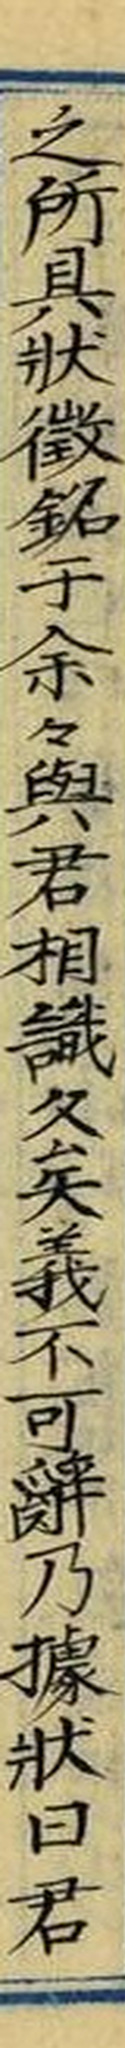之所具狀徵銘于余々與君相識久矣義不可辭乃據狀曰君
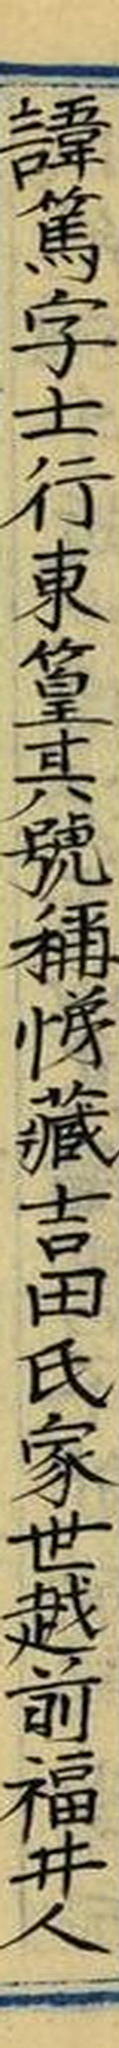諱篤字士行東篁其號稱悌藏吉田氏家世越前福井人
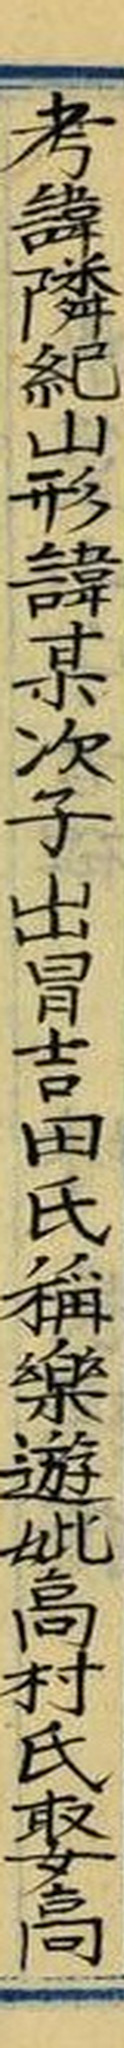考諱隣紀山形諱某次子出冒吉田氏稱樂遊妣高村氏娶高
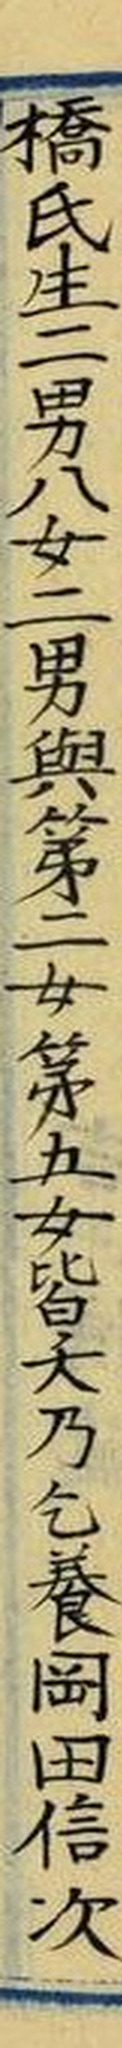橋氏生二男八女二男與第二女第五女皆夭乃乞養岡田信次
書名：温古集 四巻
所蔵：福井県文書館 Fukui Prefectural Archives
